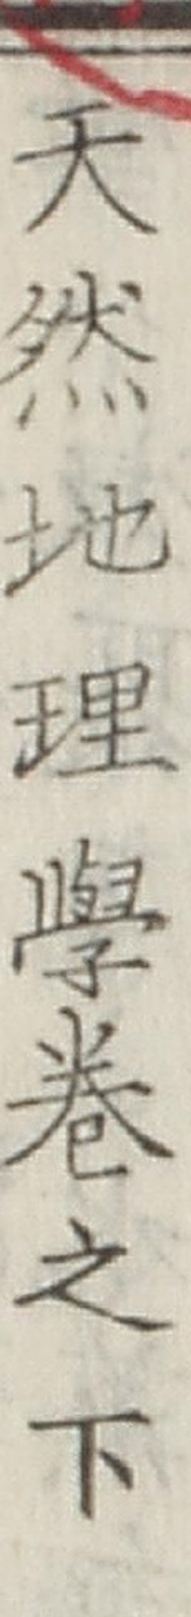天然地理学巻之下
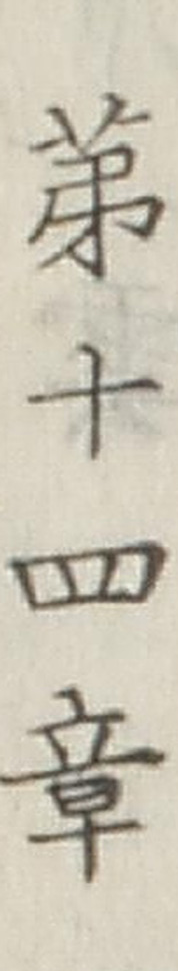第十四章
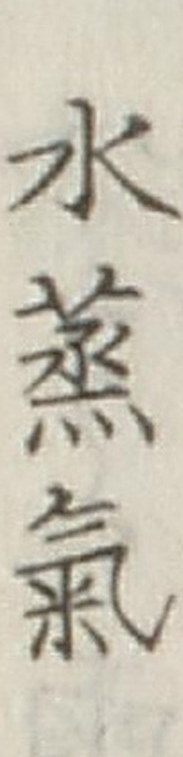水蒸気
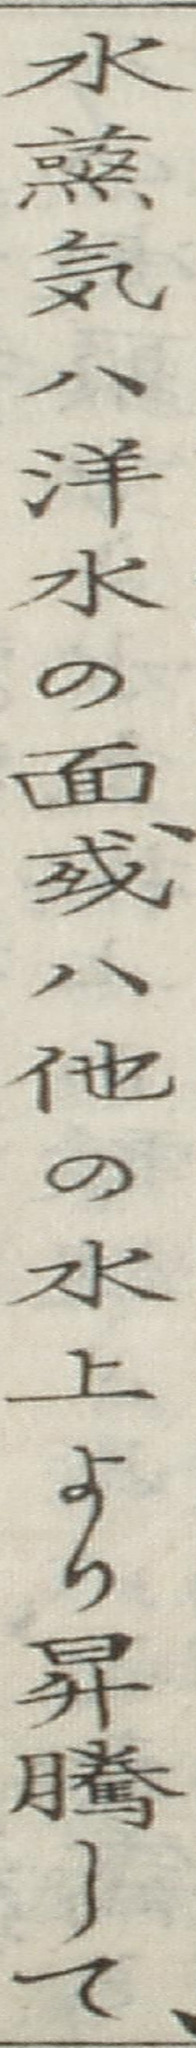水蒸気は洋水の面、或は他の水上より昇騰して、
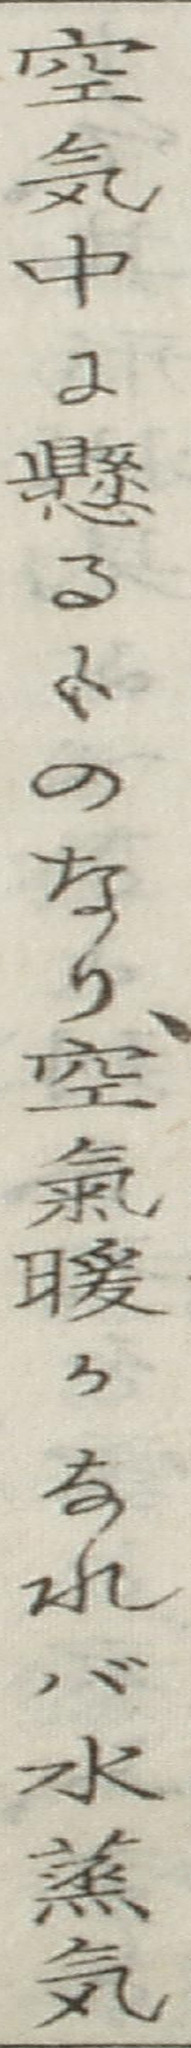空気中に懸るものなり、空気暖かなれば水蒸気
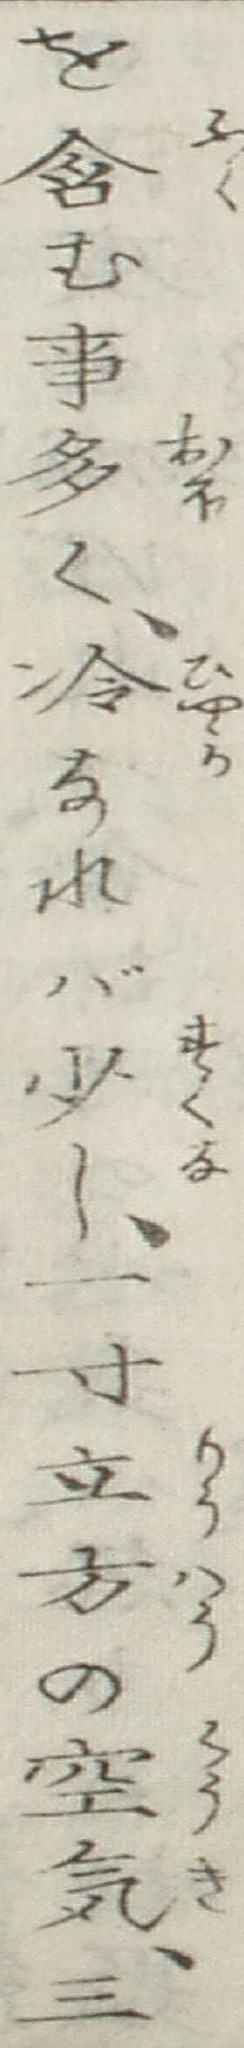を含む事多く、冷なれば少し、一寸立方の空気、三
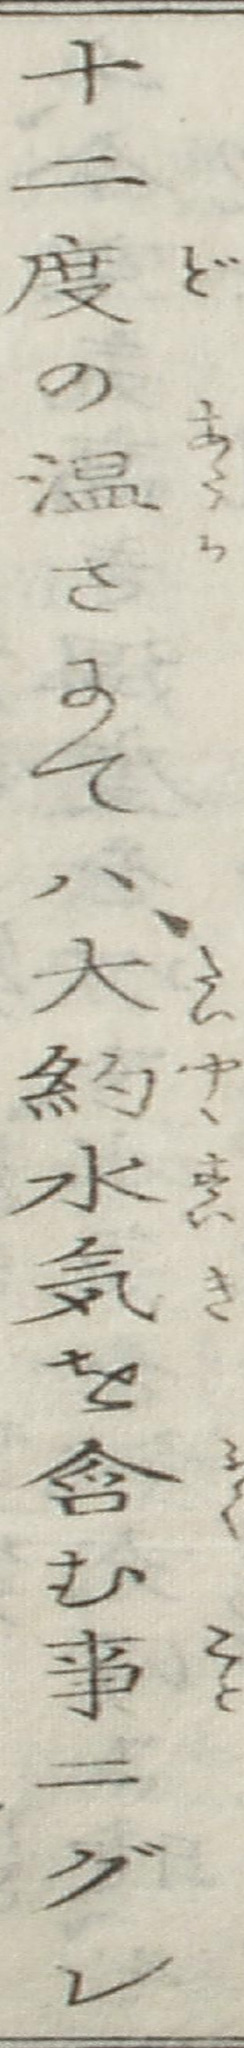十二度の温さにては、大約水気を含む事二グレ
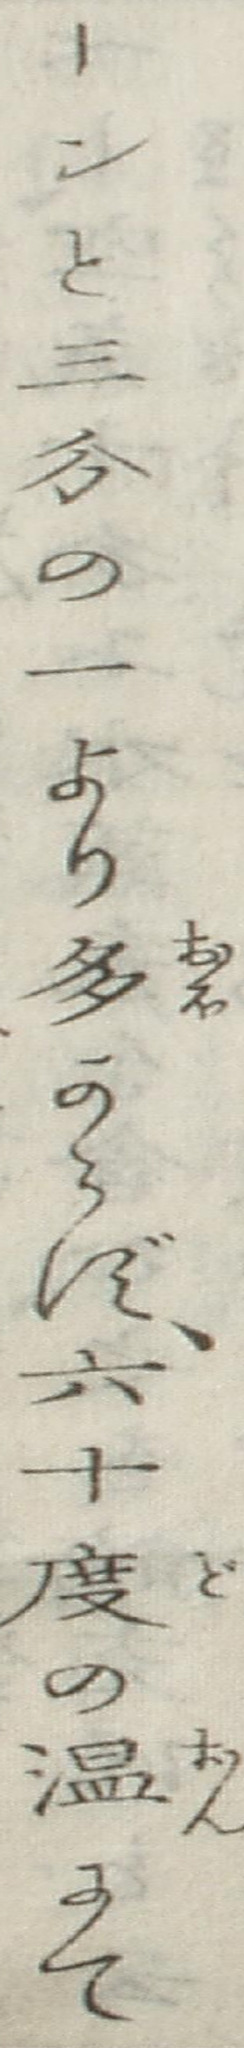ーンと三分の一より多からず、六十度の温にて
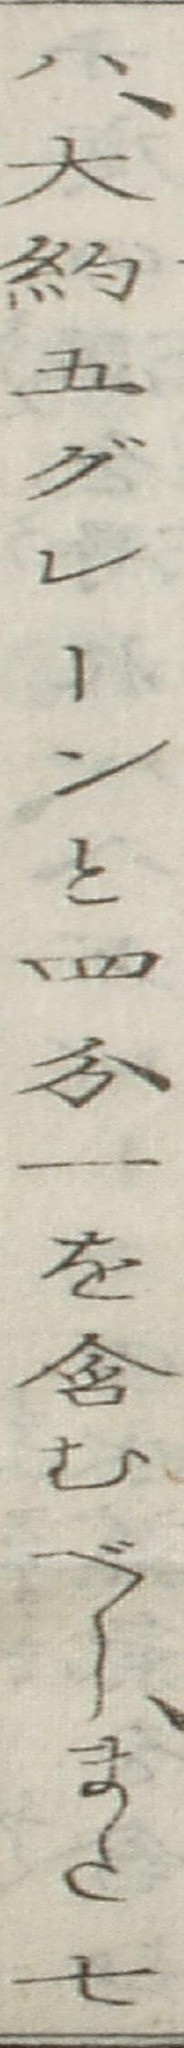は、大約五グレーンと四分一を含むべし、また七

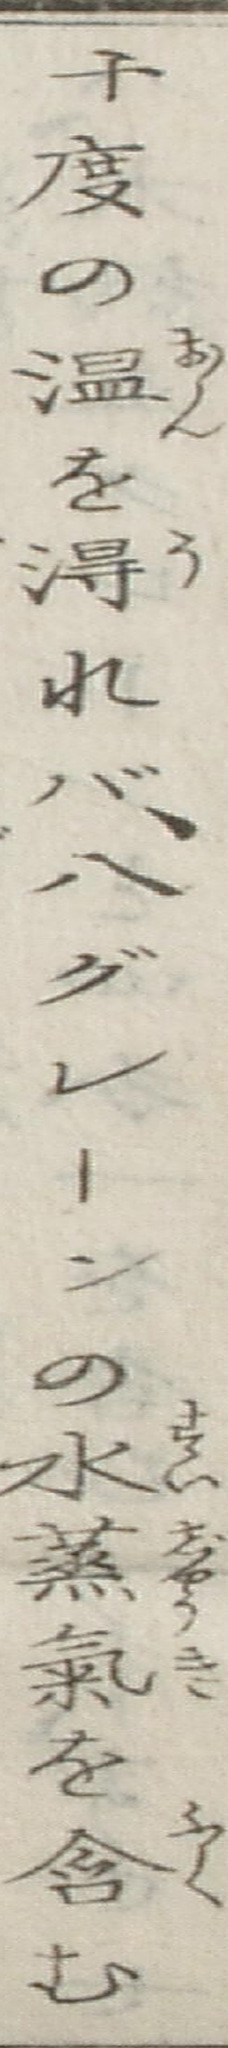十度の温を得れば、八グレーンの水蒸気を含む
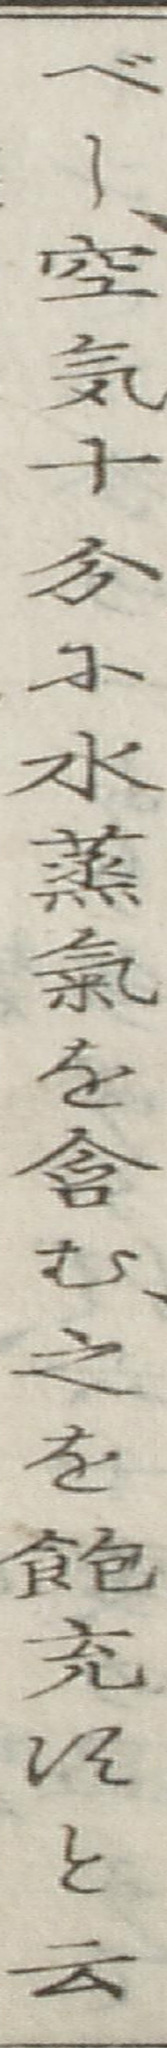べし、空気十分に水蒸気を含む、之を飽充すと云
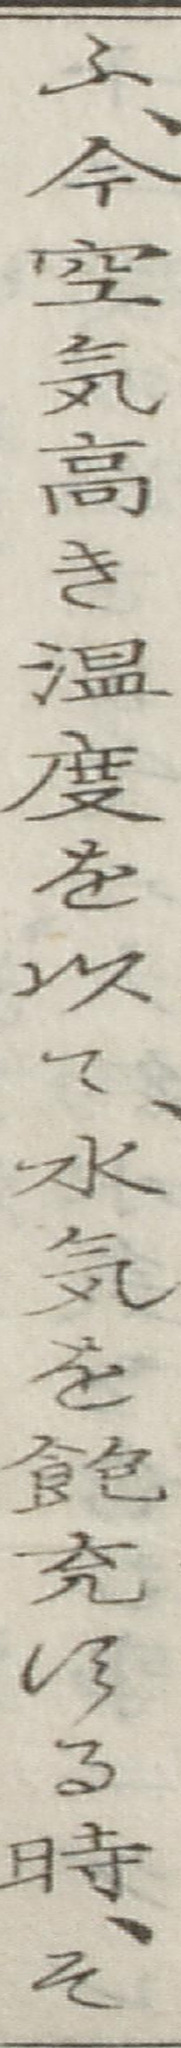ふ、今空気高き温度を以て、水気を飽充する時、そ
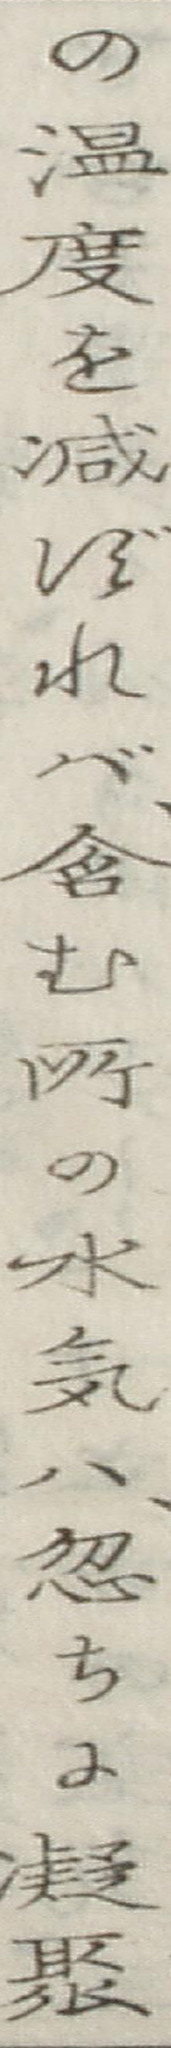の温度を減ずれば、含む所の水気は、忽ちに凝聚
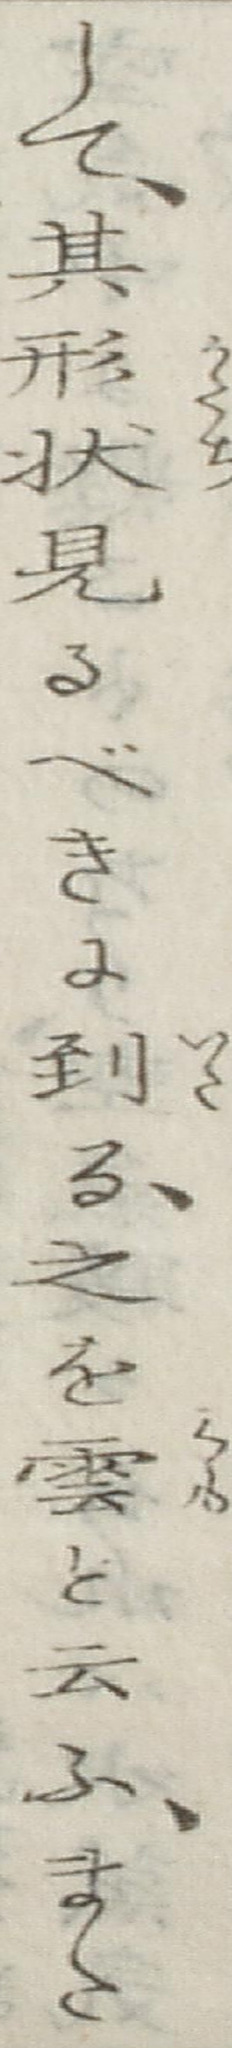して、其形状見るべきに到る、之を雲と云ふ、また
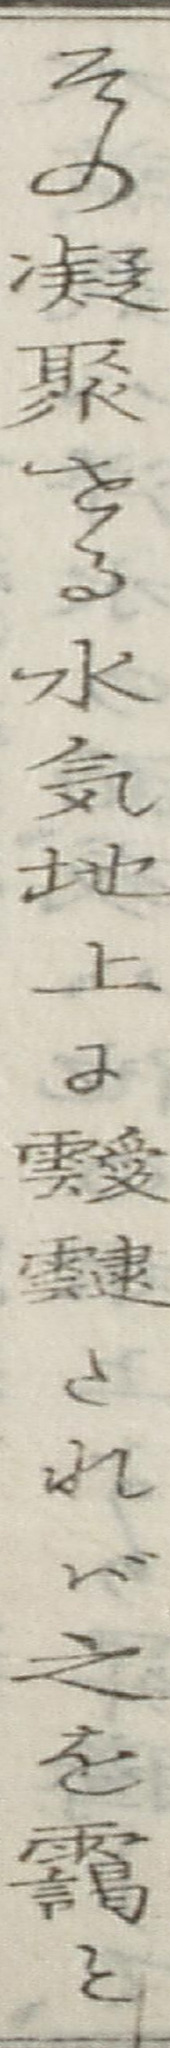その凝聚せる水気地上に靉靆たれば、之を霞と
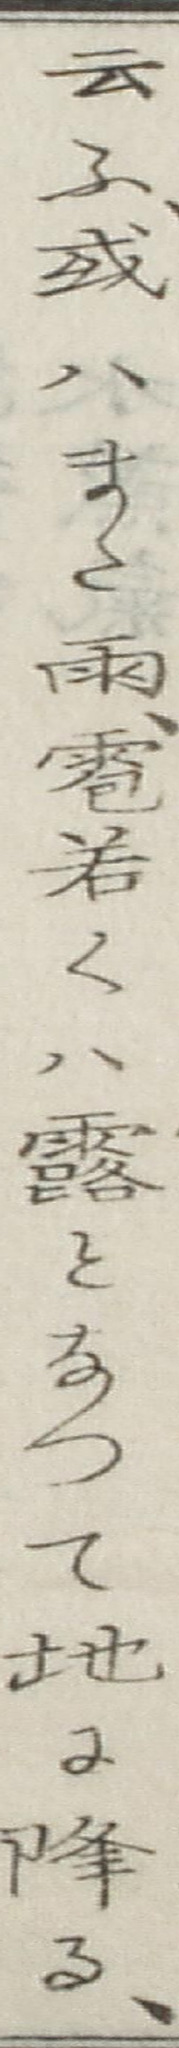云ふ、或はまた雨、雹若くは露となつて地に降る、
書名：訓蒙　天然地理學　下
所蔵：東京大学地震研究所図書室 Earthquake Research Institute Library, The University of Tokyo, JAPAN
